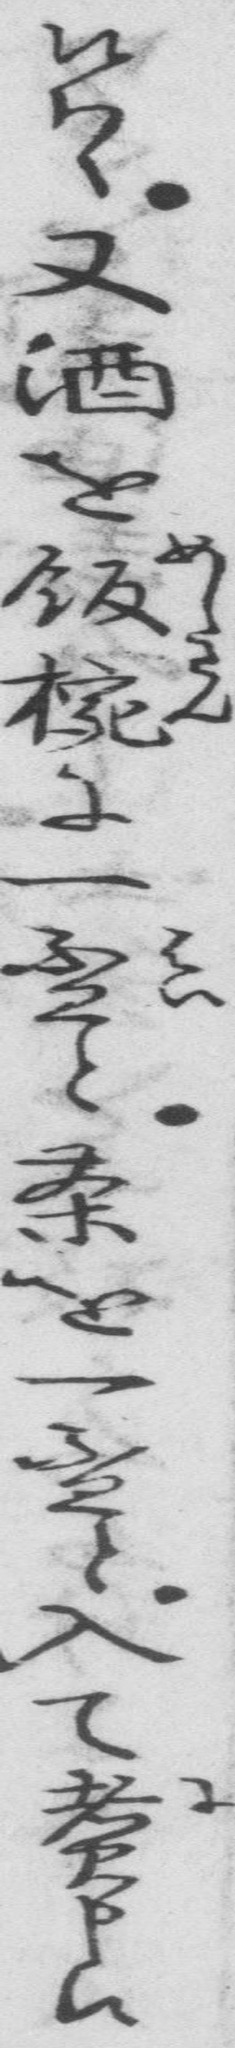候はゝ。又酒を飯椀に一盃と。茶を一盃と。入て煮申候
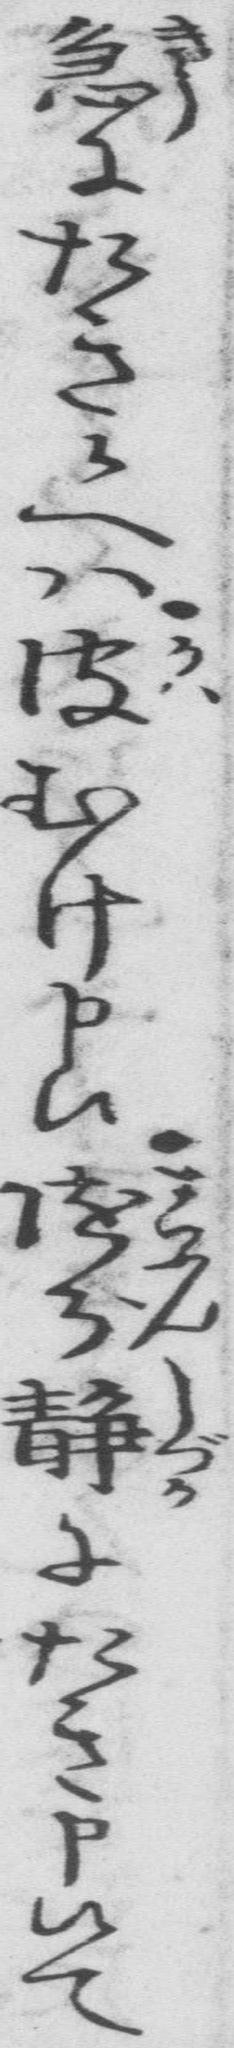急にたき候へは。皮むけ申候。随分静にたき申候て
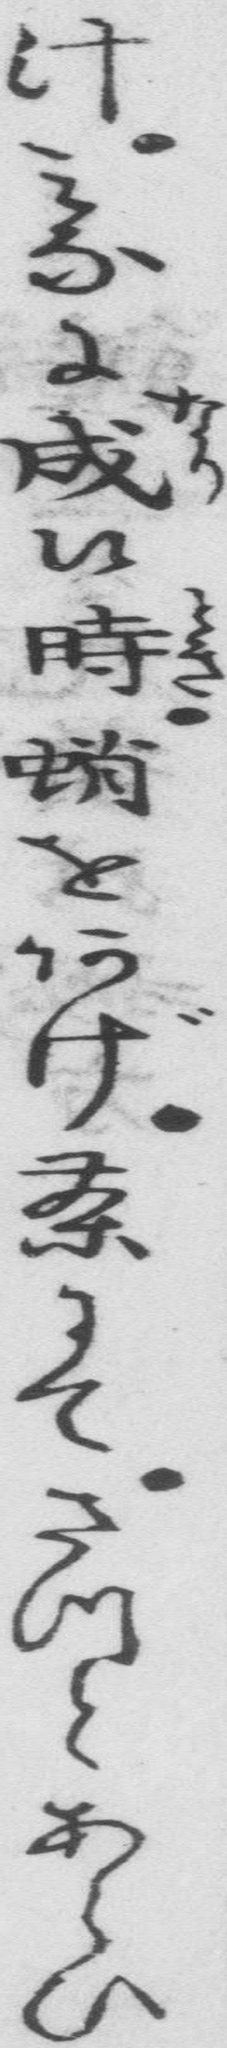汁。みなに成候時。蛸をあげ。茶にて。さつとあらひ
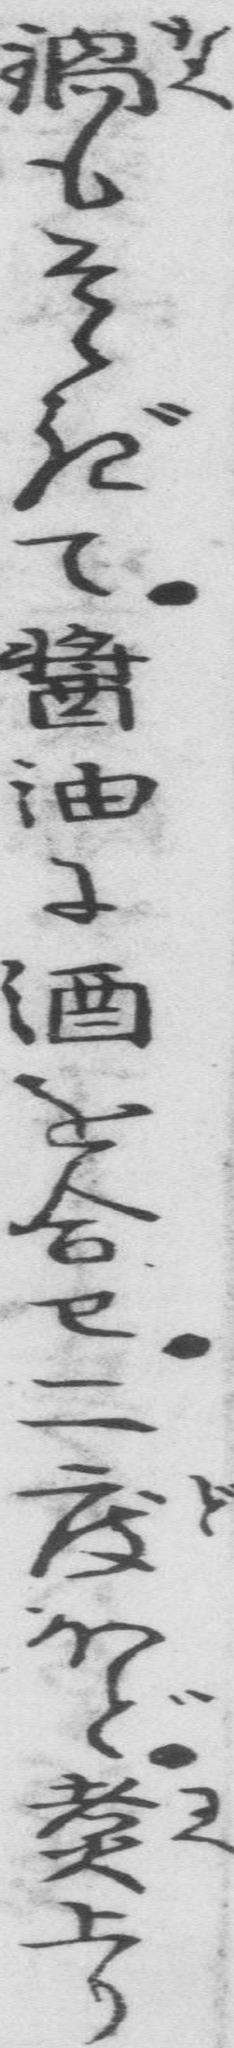鍋もそゝぎて。醤油に酒を合せ。二度ほど。煮上り
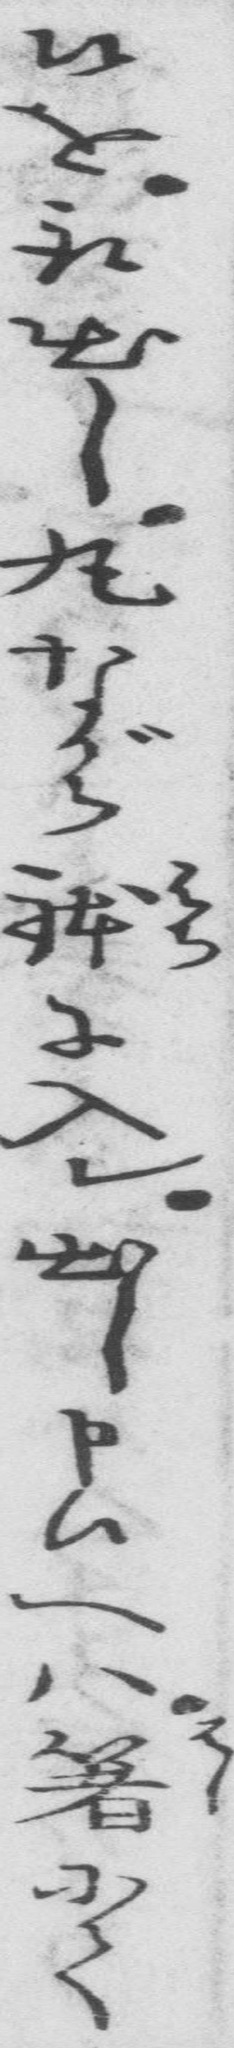候を。取出し。丸ながら鉢に入れ。出し申候へは。箸にて
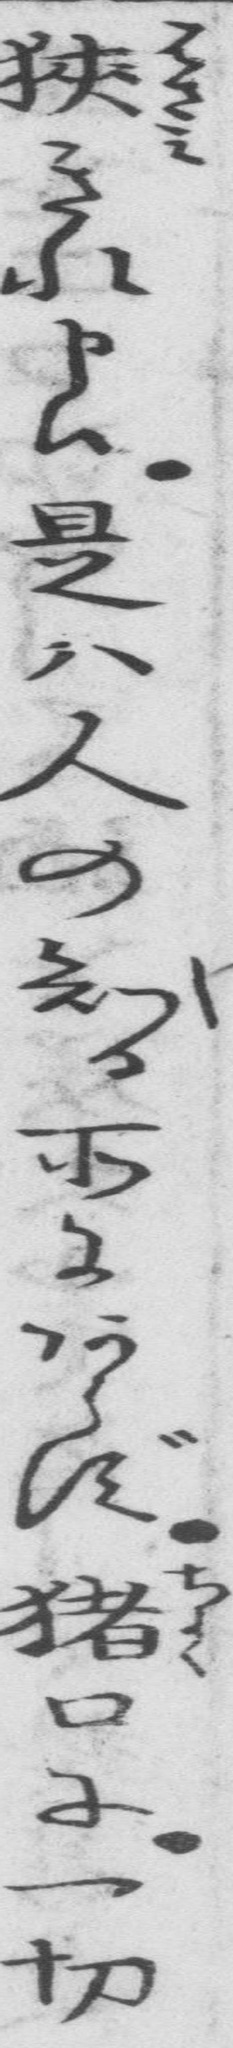挟きれ申候。是は人の知る所にあらず。猪口に。一切
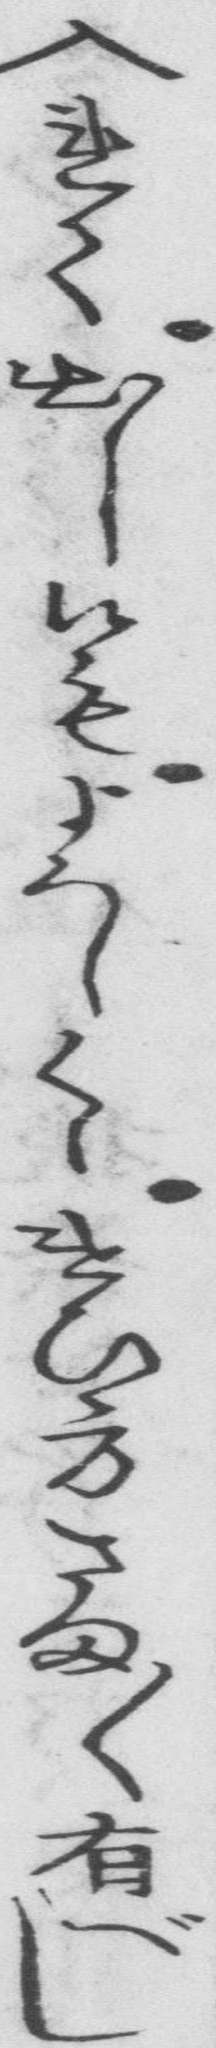入れて。出し候も。よろしく候。遣ひ方さま〳〵有べし
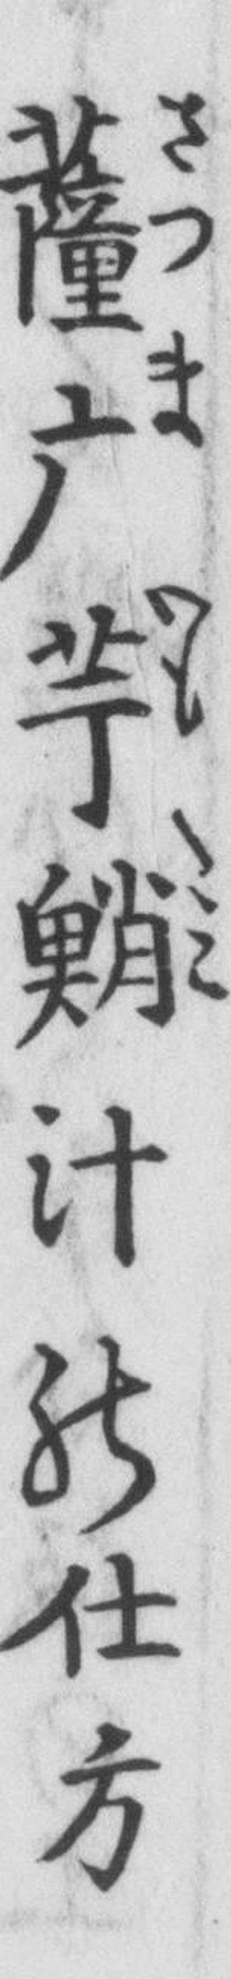薩摩芋蛸汁の仕方
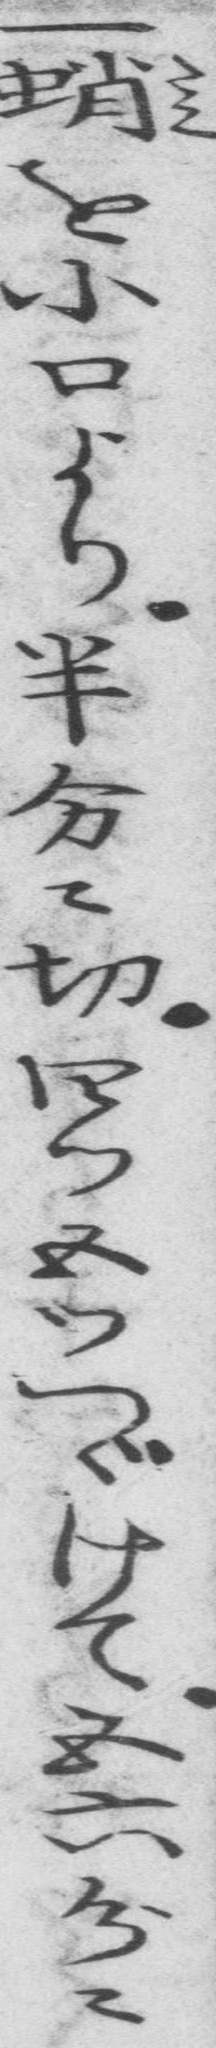一蛸を小口より。半分に切。四ツ五ツつゞけて。五六分に
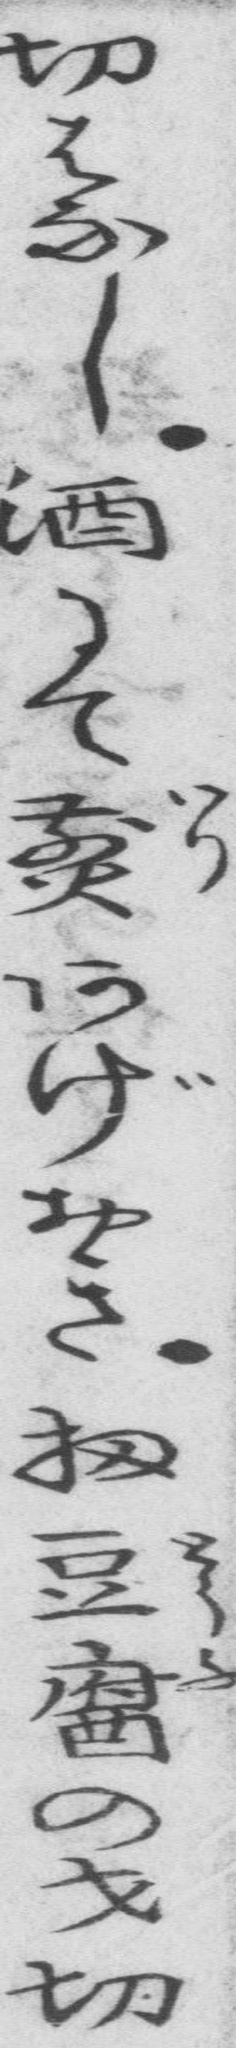切はなし。酒にて煮あげおき。扨豆腐の才切
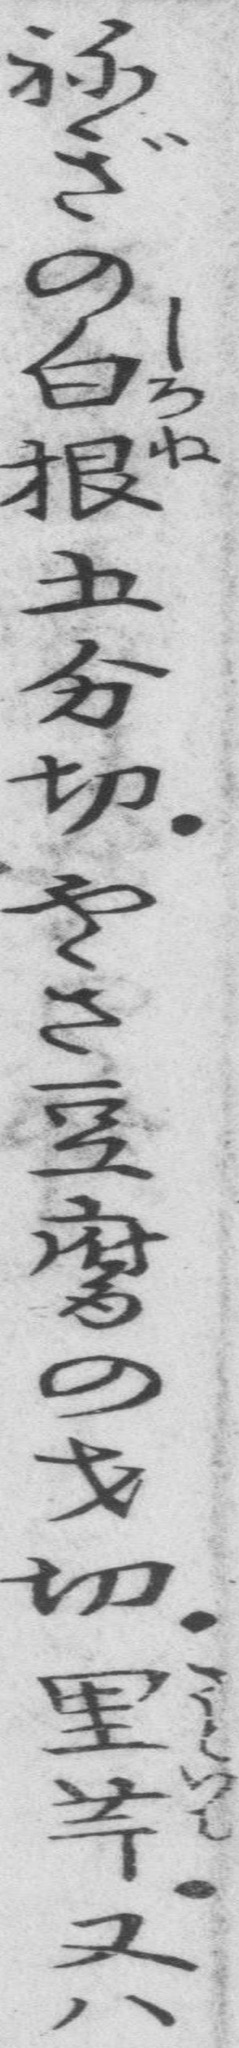ねぎの白根五分切。やき豆腐の才切。里芋。又は
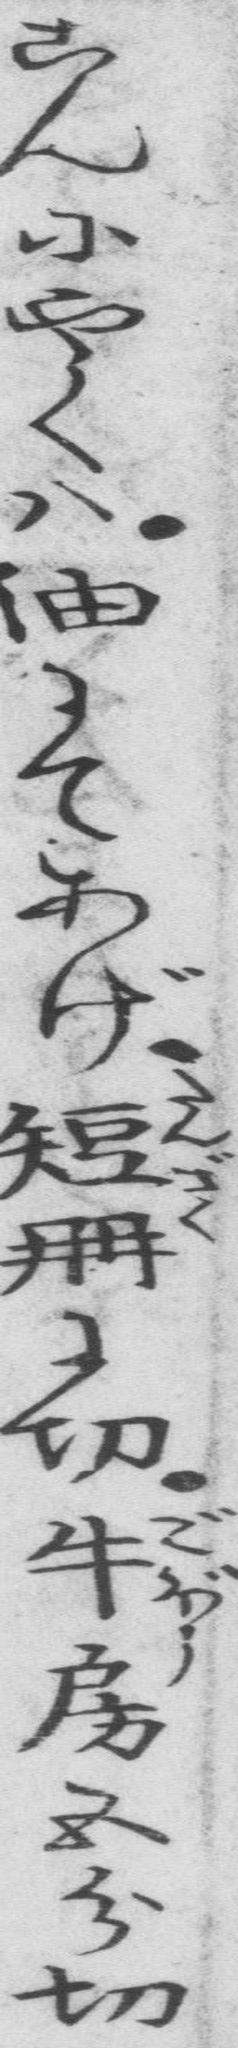こんにやくは。油にてあげ。短冊に切。牛房五分切
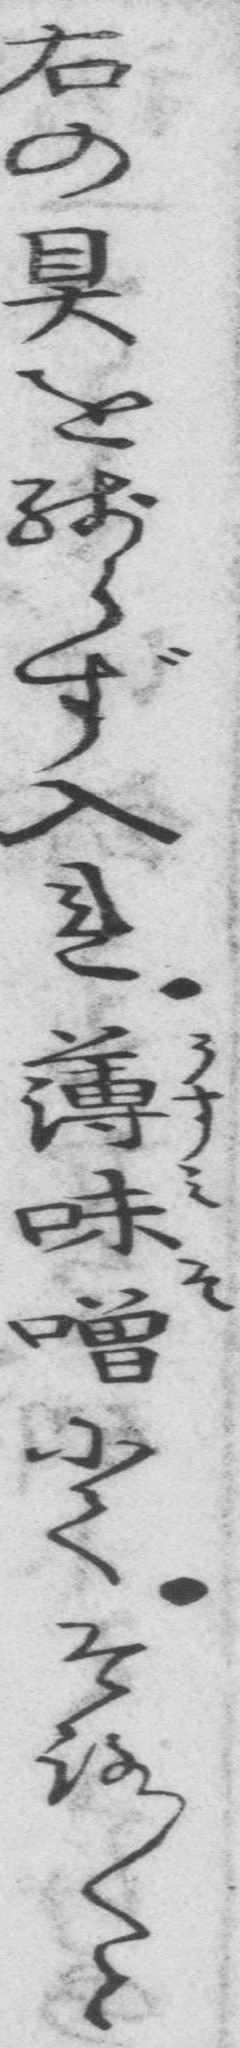右の具を残らず入れ。薄味噌にて。そろ〳〵と
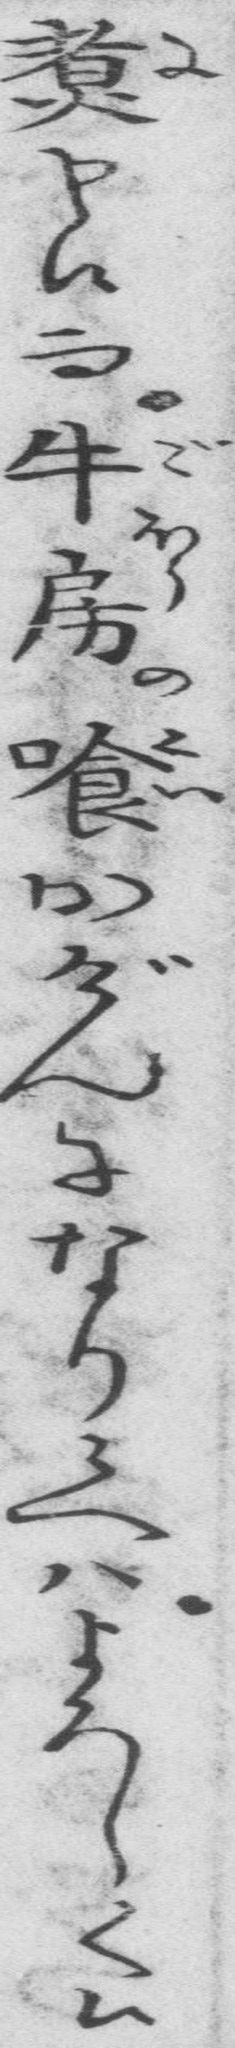煮申候而。牛房喰かげんになり候へは。よろしく候
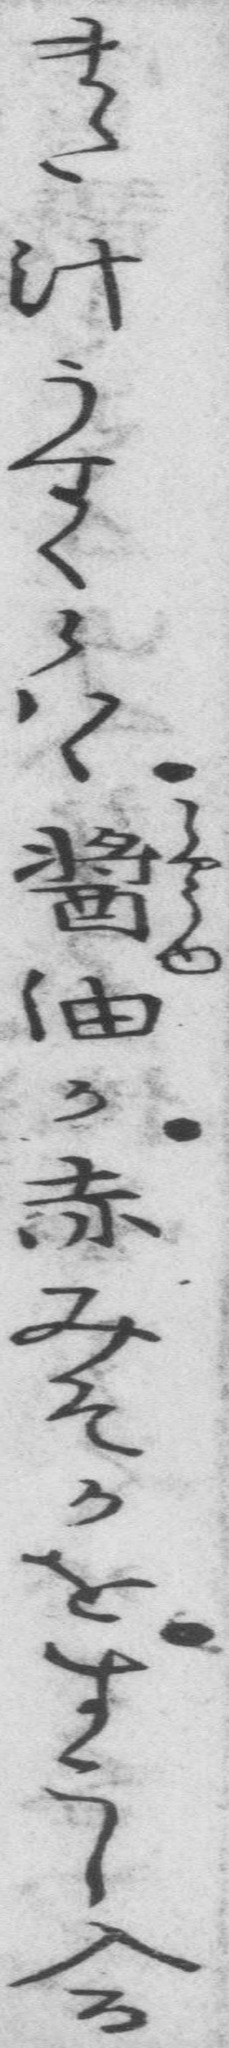また汁うすく候はゝ。醤油か。赤みそかを。すこし入る
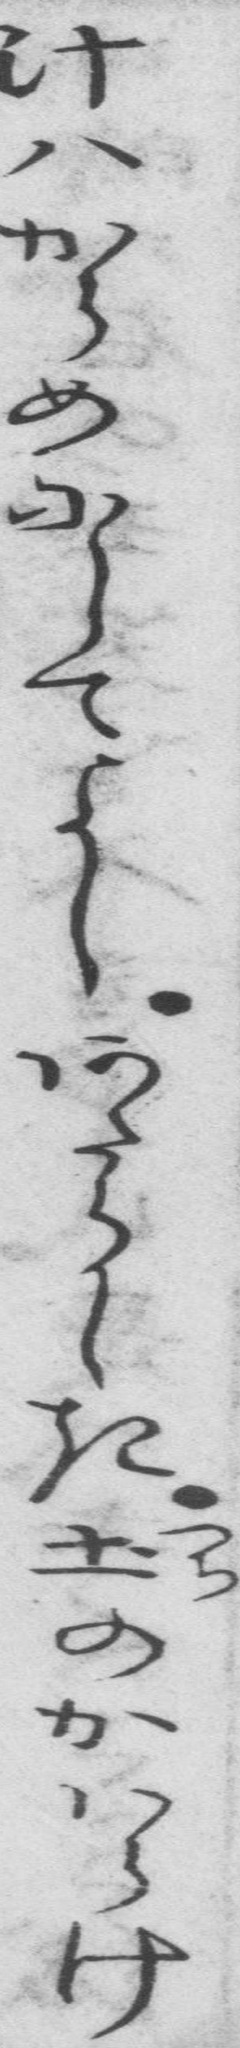汁はからめにしてよし。あたらしき。土のかはらけ
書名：萬寳料理秘密箱
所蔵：大阪府立大学学術情報センター 国文学研究資料館
